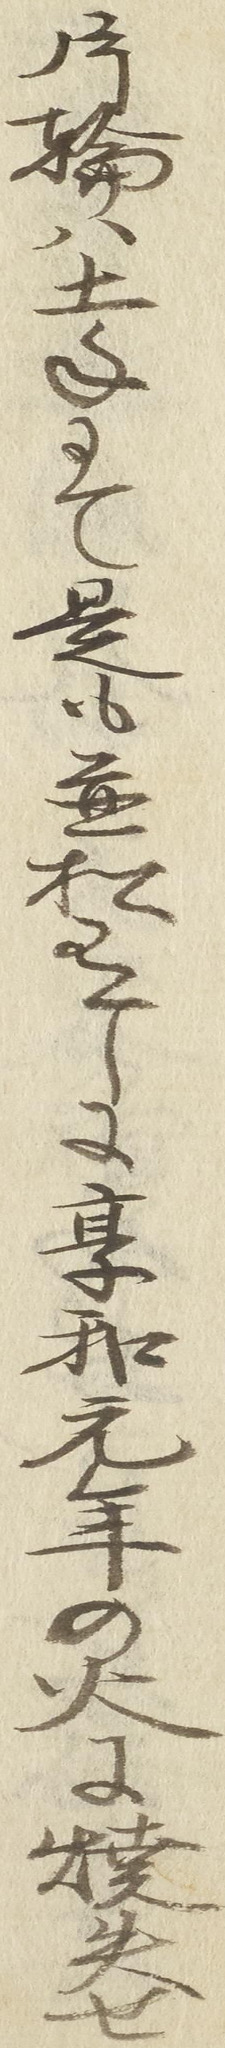片輪ハ土手にて是も並松有しに享和元年の火に焼失せ

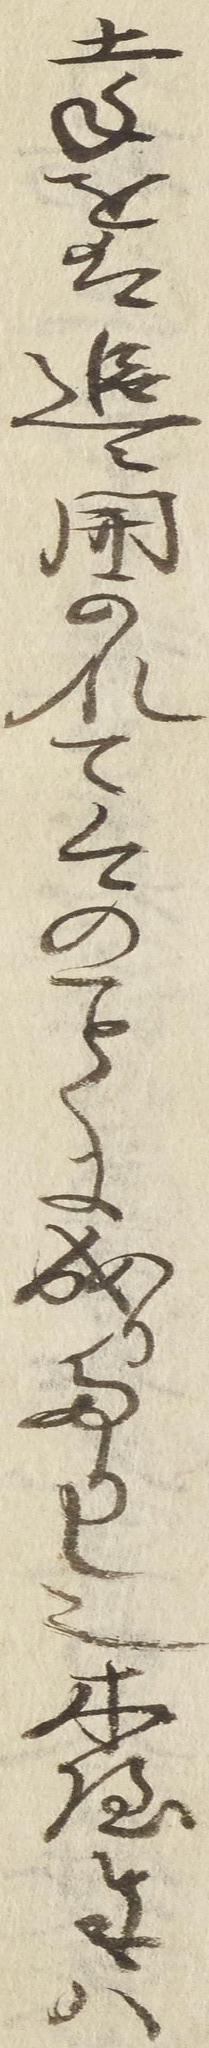土手をは追々開かれて今のことくに成りたりし也木屋ともハ
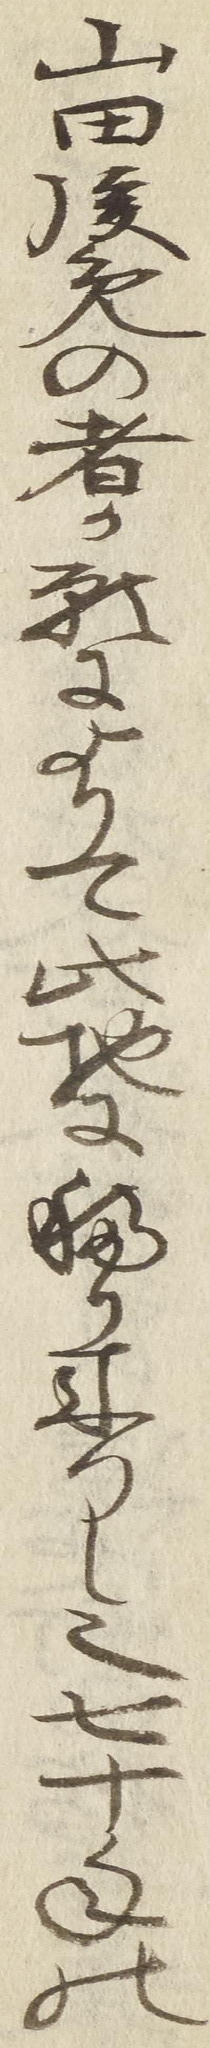山田後免の者か願によりて此地に移り来りし也七十年の
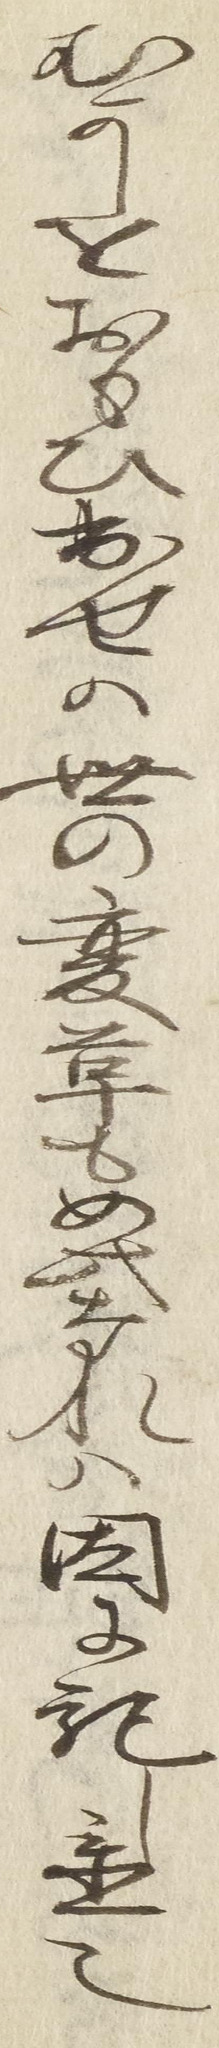むかしをおもひ前せの世の変草の如此なれハ因に記し置也
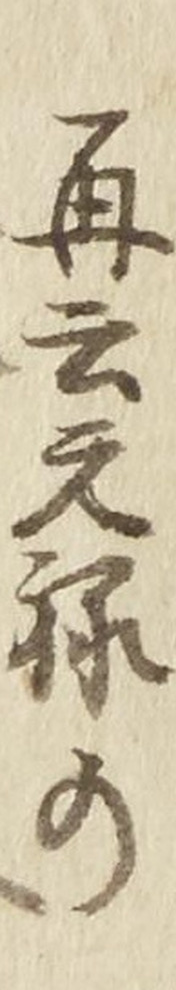再云元禄の
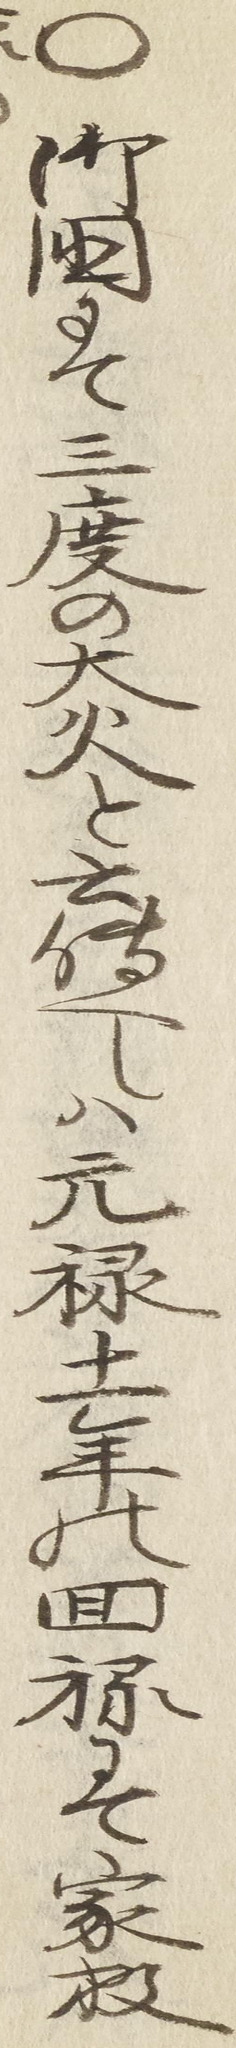〇御国にて三度の大火と云伝へしは元禄十一年の回禄にて家数
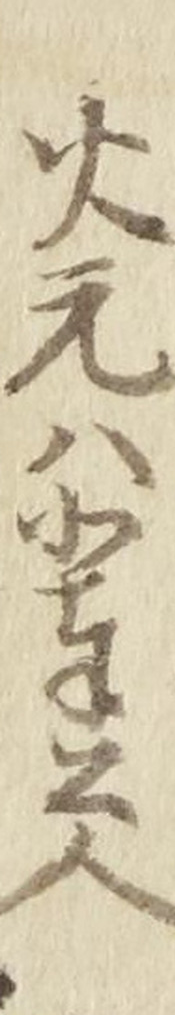火元は北奉公人
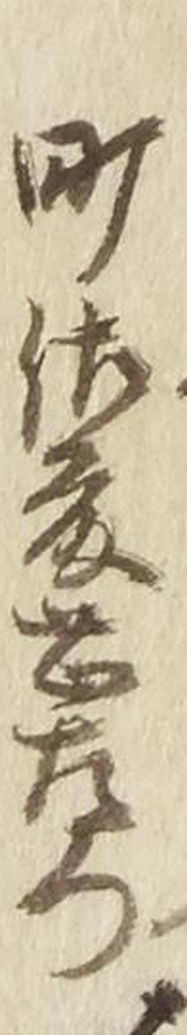町佐藤甚左衛門
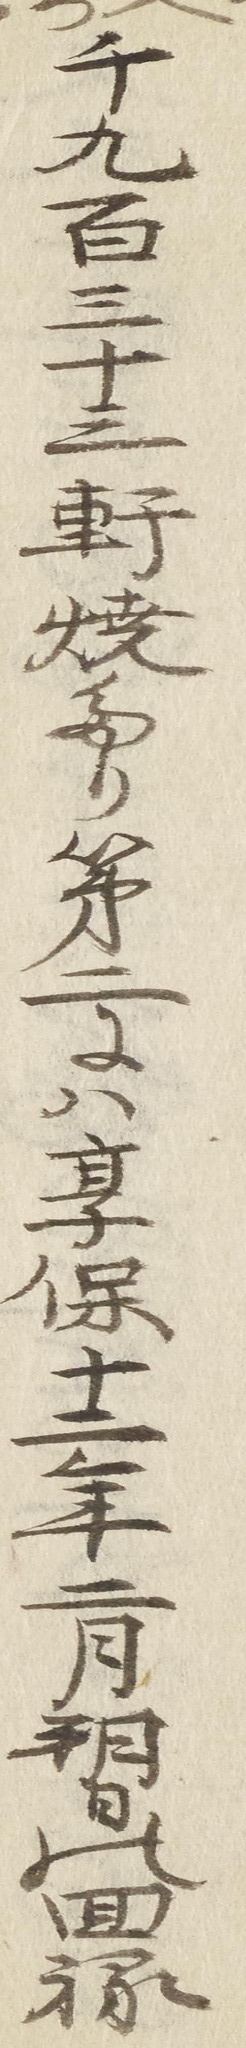千九百三十三軒焼たり第二には享保十二年二月朔日の回禄
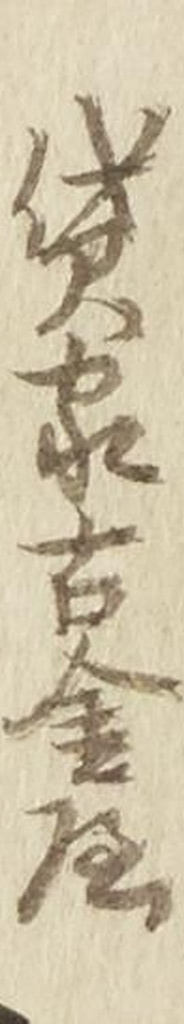貸家古金屋
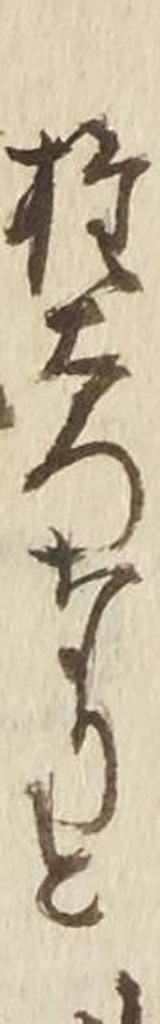権右衛門なりと
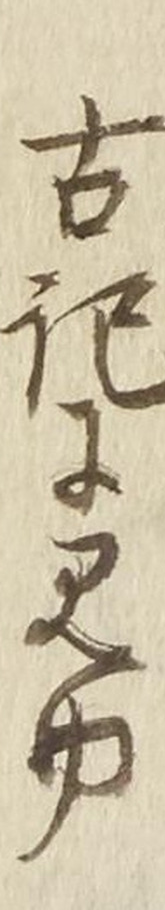古記に見ゆ
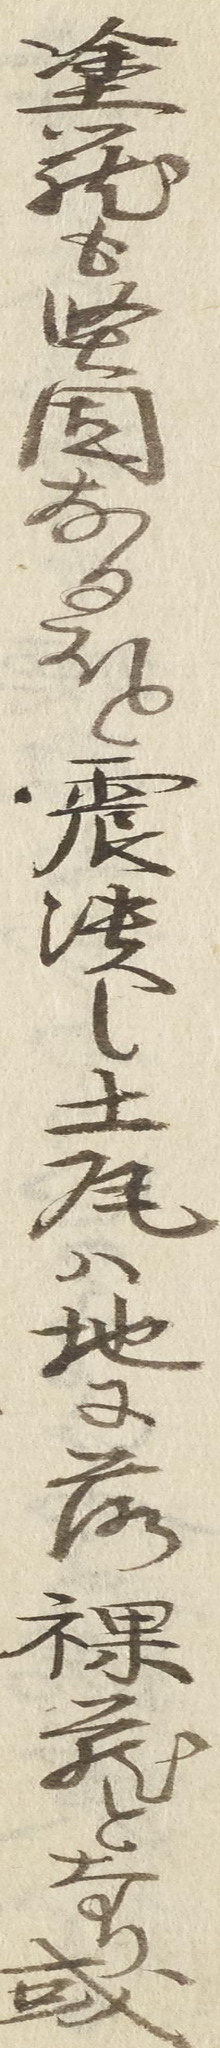塗籠も堅箇固なるほと震潰し土瓦は地に落ち裸蔵となり或
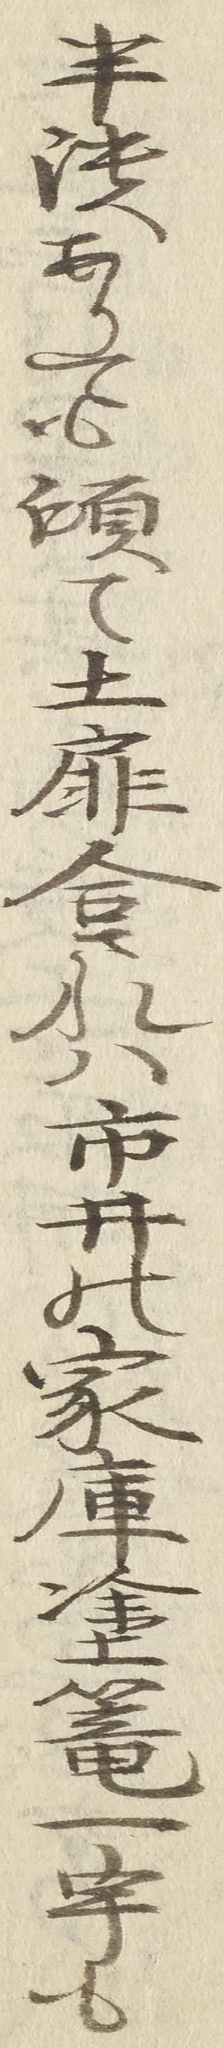半潰ありても顧て土扉合されは市井の家庫塗篭一宇も
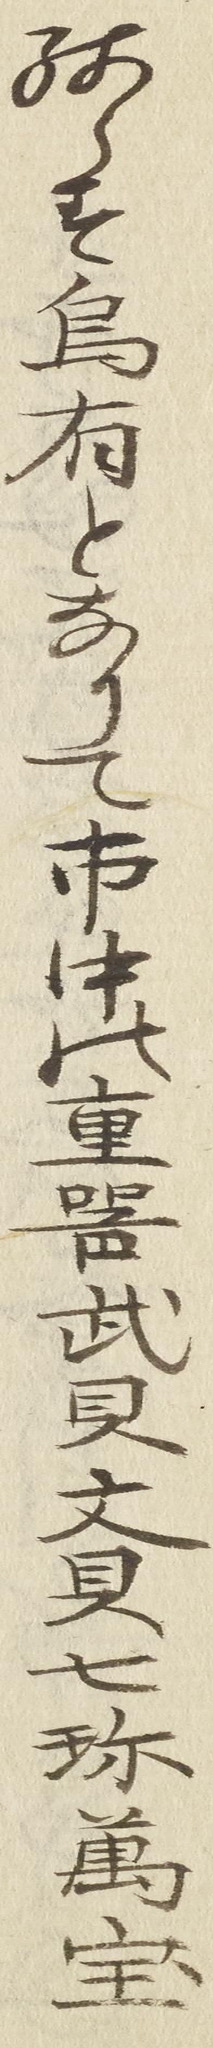残らす烏有となりて市中の重器武具七珍萬宝
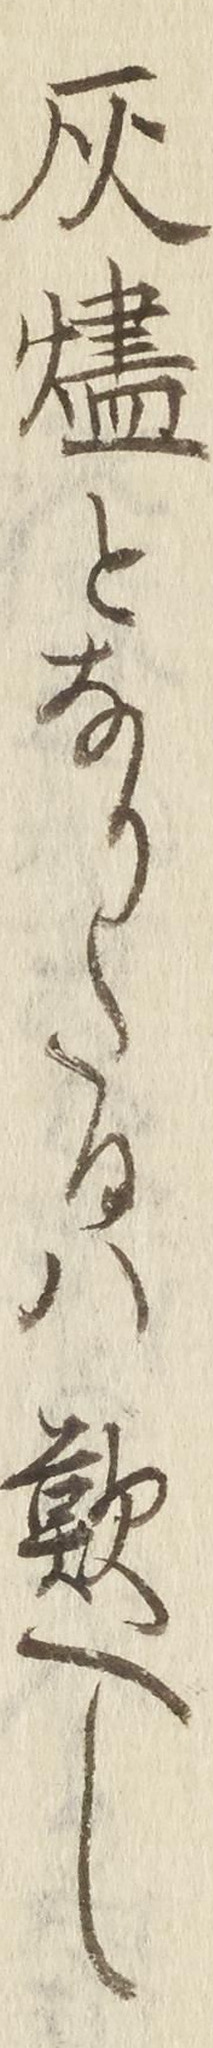灰燼となりたるは歎へし
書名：地震記　上
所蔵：東京大学地震研究所図書室 Earthquake Research Institute Library, The University of Tokyo, JAPAN
